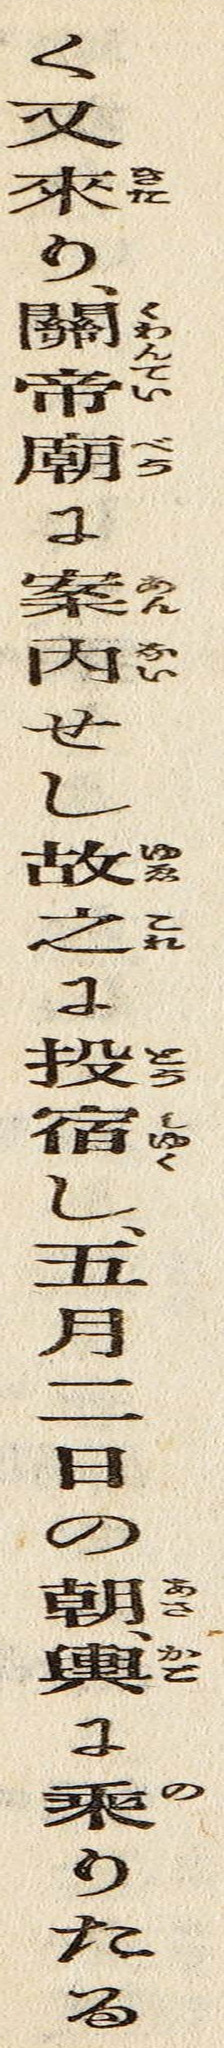く又来り、関帝廟に案内せし故之に投宿し、五月二日の朝、輿に乗りたる
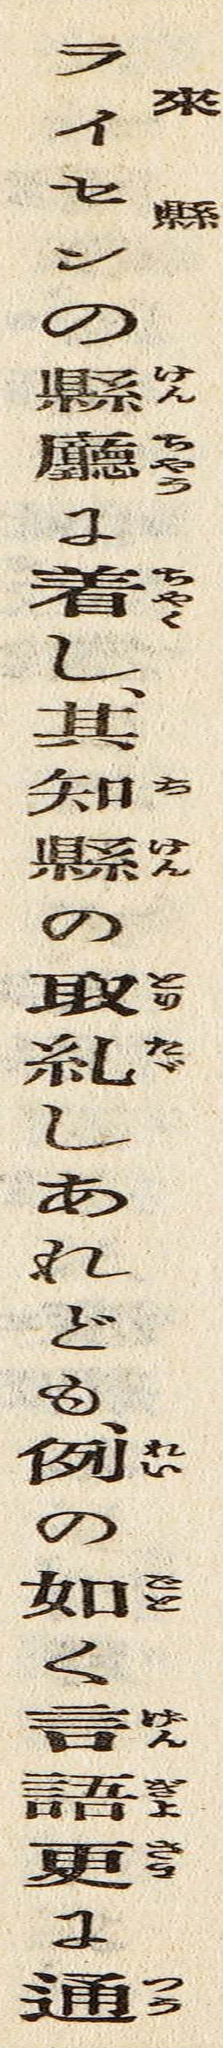ライセンの県庁に着し、其知県の取糺しあれども、例の如く言語更に通
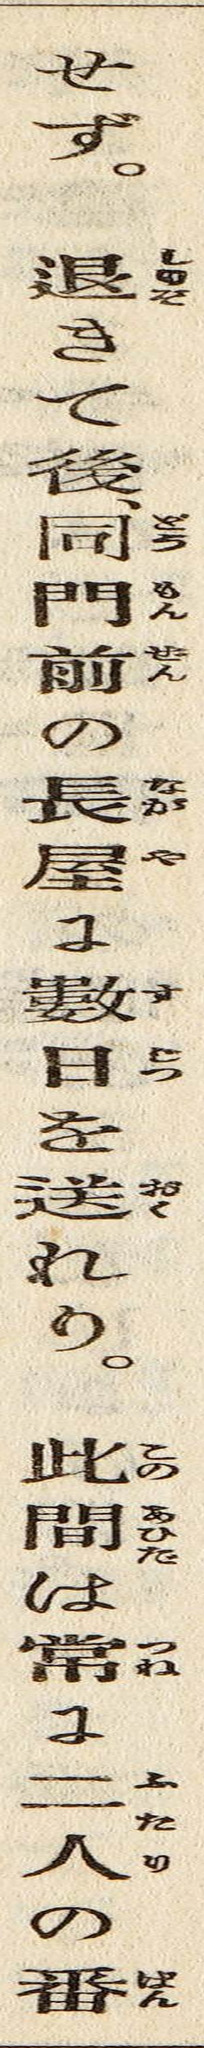せず。退きて後、同門前の長屋に数日を送れり。此間は常に二人の番
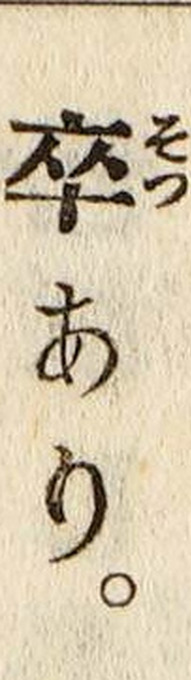卒あり。
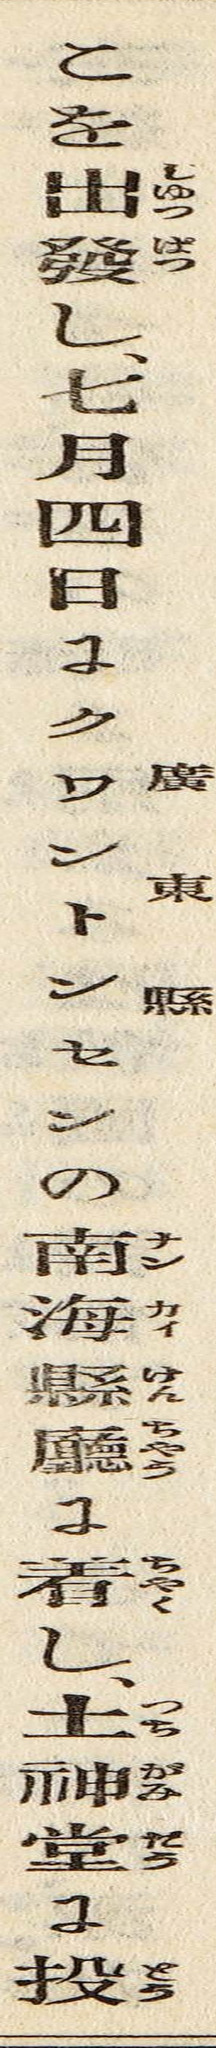こを出発し、七月四日にクワントンセンの南海県庁に着し、土神堂に投
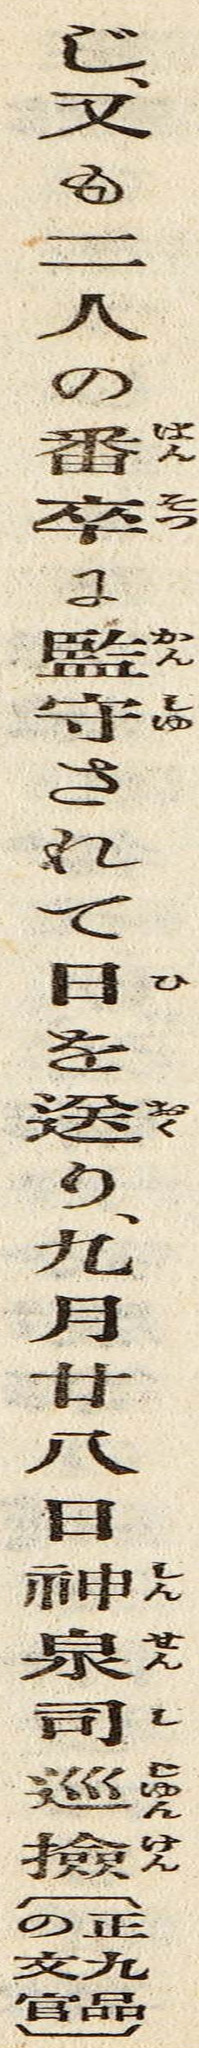じ、又も二人の番卒に監守されて日を送り、九月廿八日神泉司巡撿[正九品の文官]
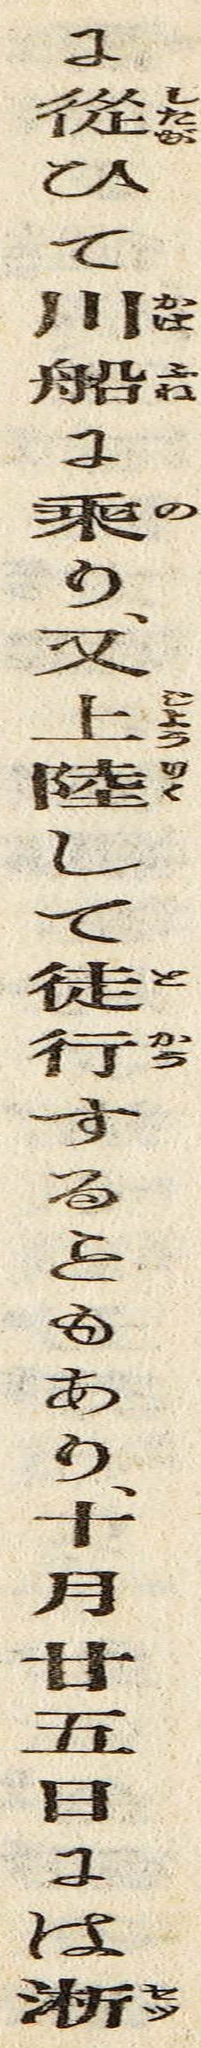に従ひて川船に乗り、又上陸して徒行することもあり、十月廿五日には浙
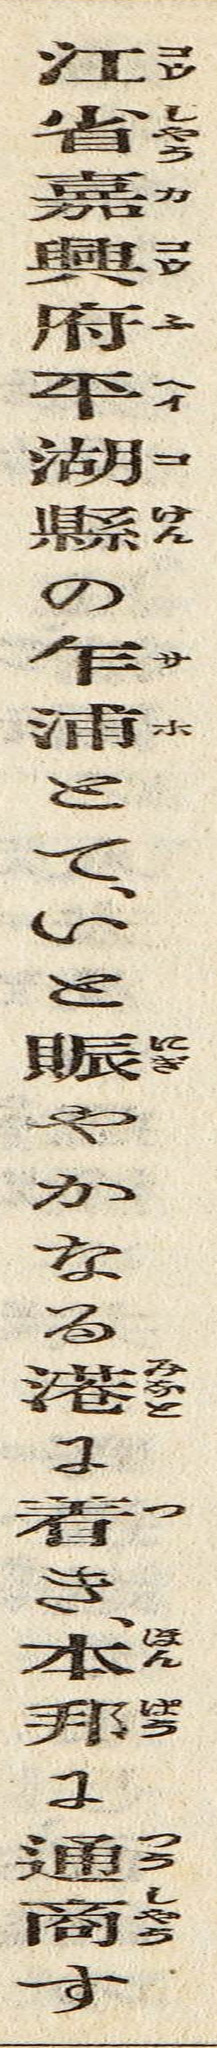江省嘉興府平湖県の乍浦とて、いと賑やかなる港に着き、本法に通商す
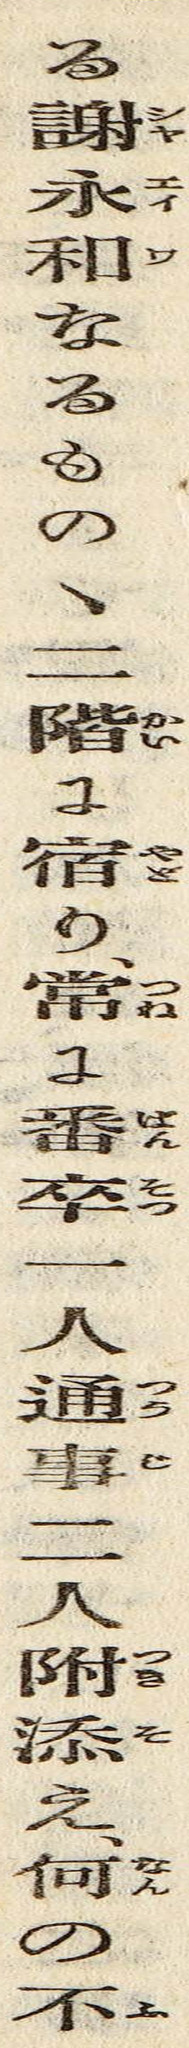る謝永和なるものゝ二階に宿り、常に番卒一人通事二人附添え、何の不
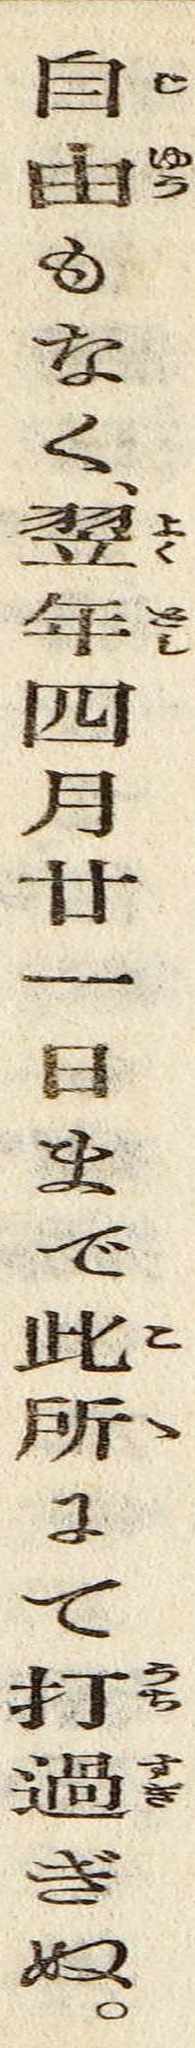自由もなく、翌年四月廿日一日まで此所にて打過ぎぬ。
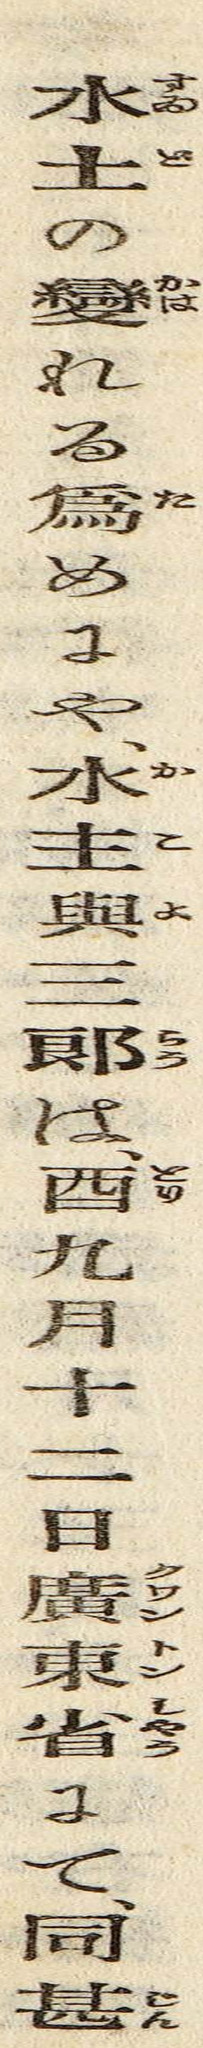水土の変れる為めにや、水主与三郎は、酉九月十二日広東省にて、同甚

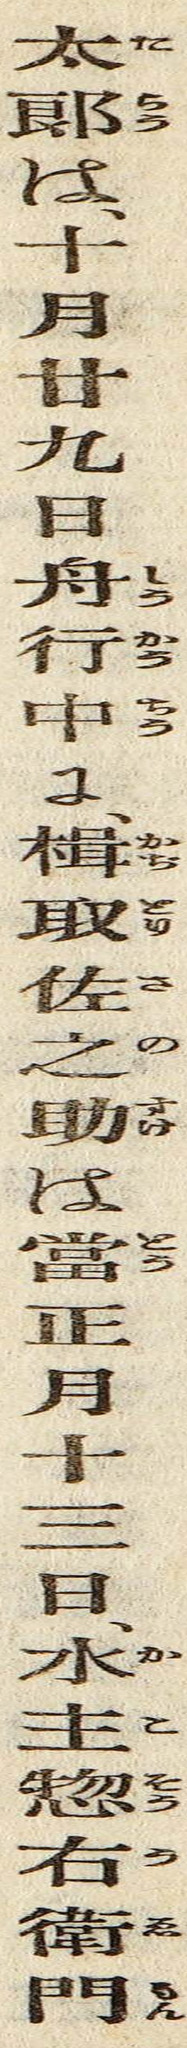太郎は十月廿九日舟行中に、楫取佐之助は当正月十三日、水主惣右衛門
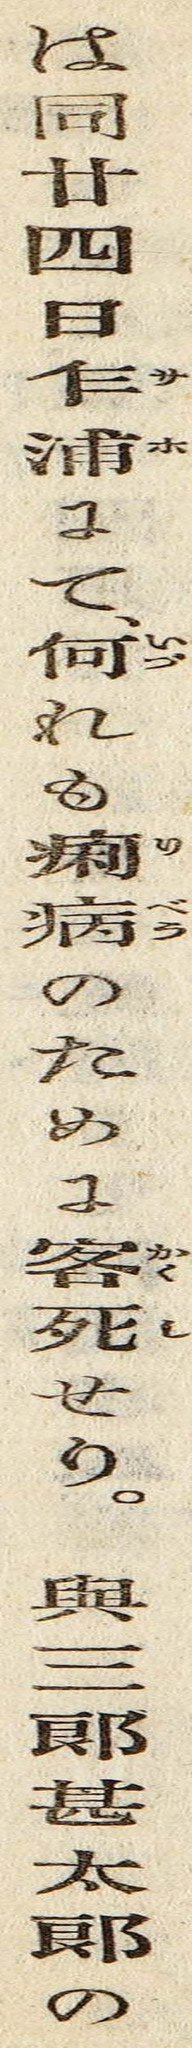は同廿四日乍浦にて何れも痢病のために客死せり与三郎甚太郎の
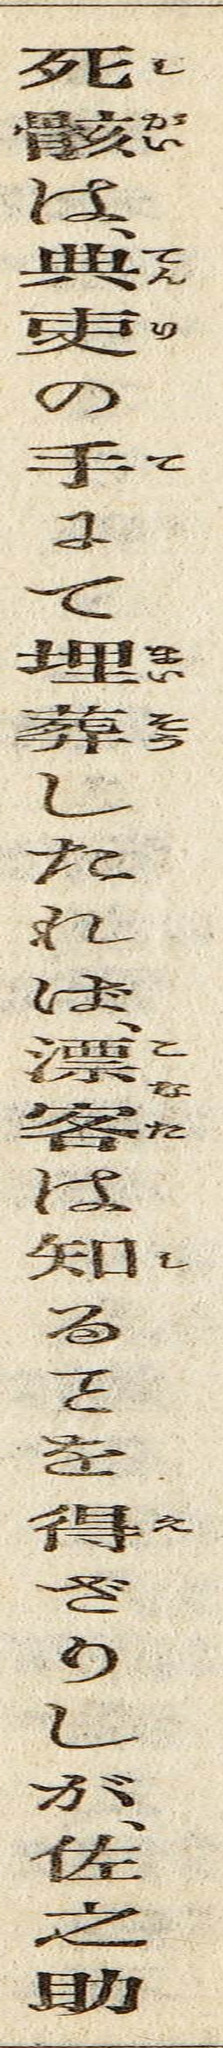死骸は典吏の手にて埋葬したれば、漂客は知ることを得ざりしが、左之助
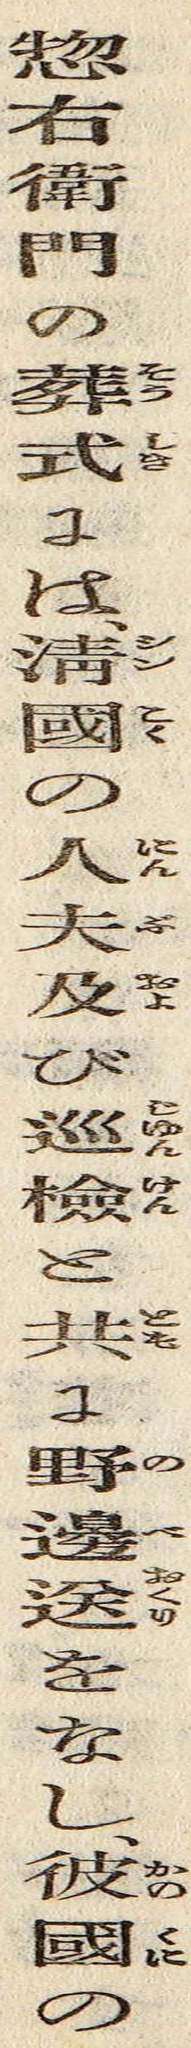惣右衛門の葬式には、清国の人夫及び巡検と共に野辺送をなし、彼国の
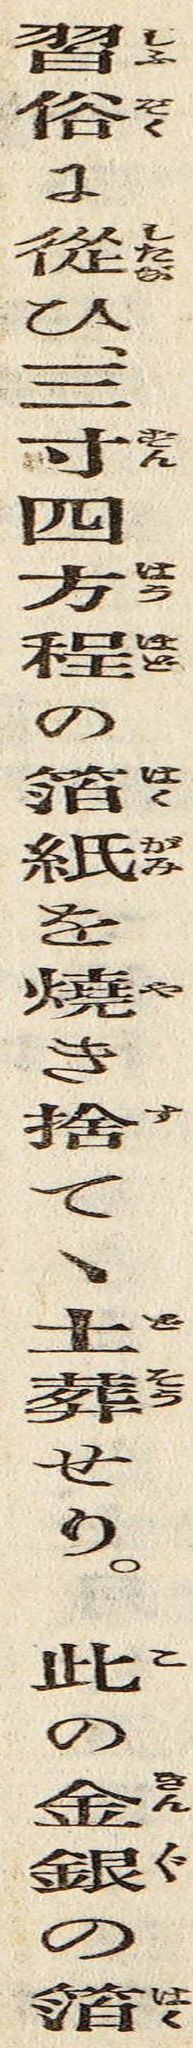習俗に従ひ、三寸四方程の箔紙を焼き捨てゝ土葬せり。此の金銀の箔
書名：日本漂流譚
